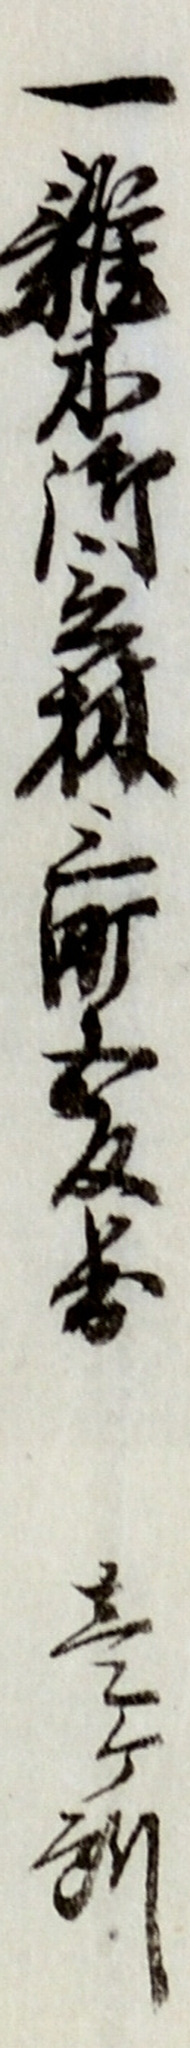一雑木御立林三町五反歩壱ケ所
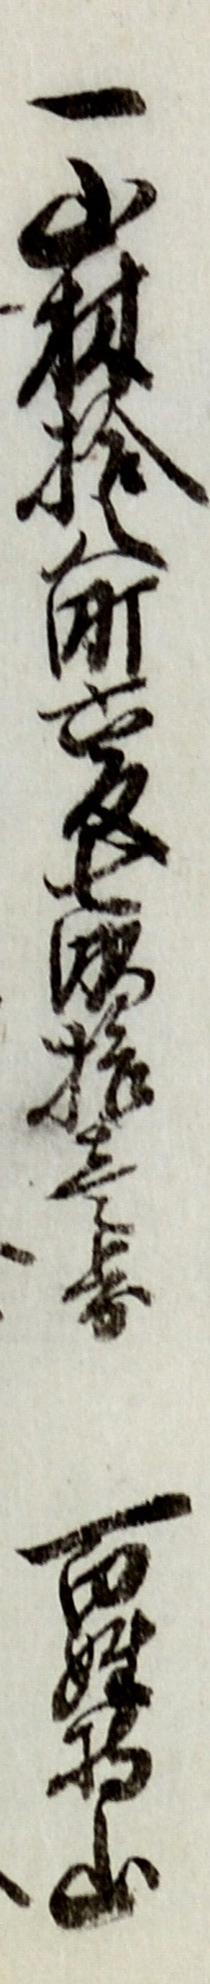一山林拾八町六反七畝拾壱歩百姓持山
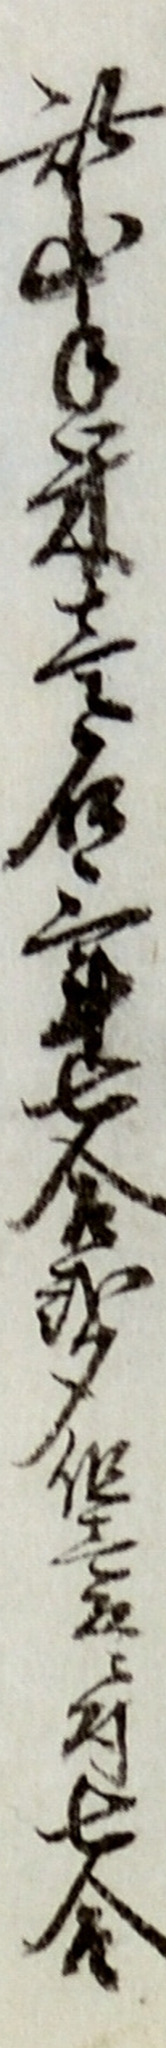此山手米壱石三斗七合弐勺但壱反ニ付七合
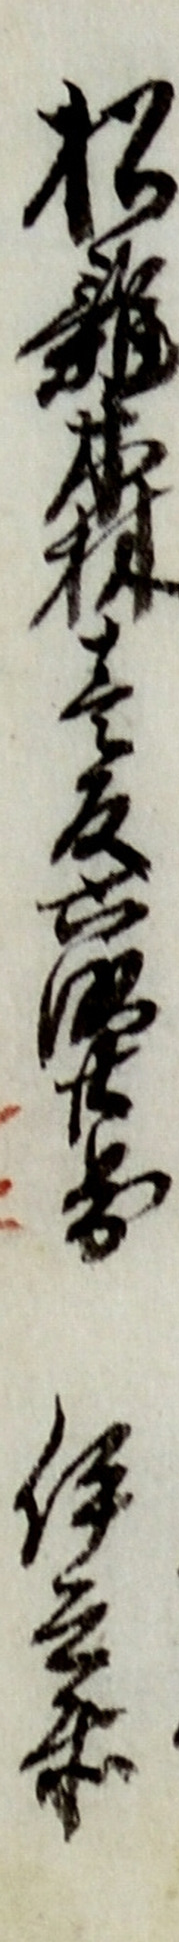松雑木林壱反六畝廿歩伊兵衛

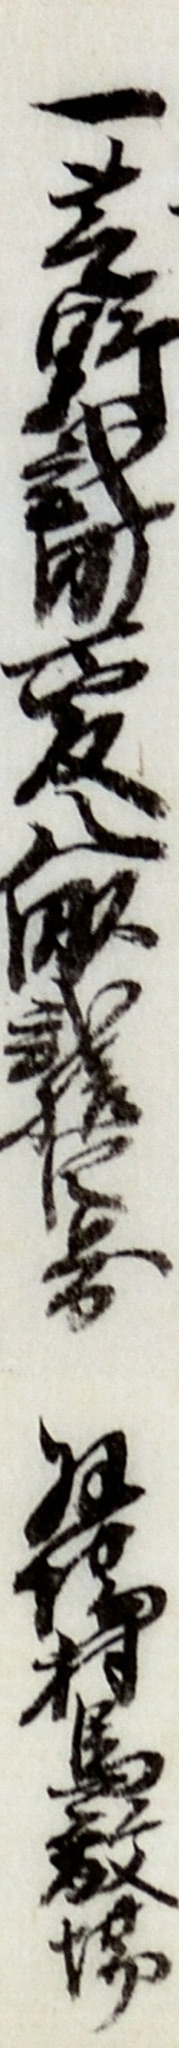一芝野弐町六反八畝弐拾四歩羽場村馬放場

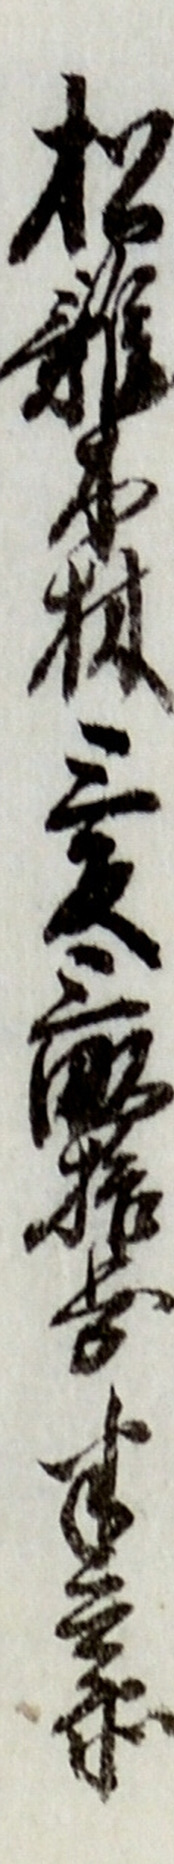松雑木林三反三畝拾歩半兵衛
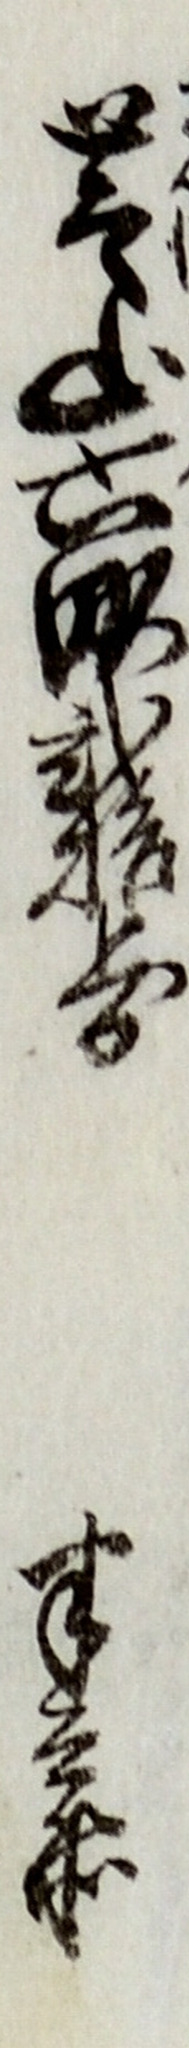芝山六畝弐拾歩半兵衛
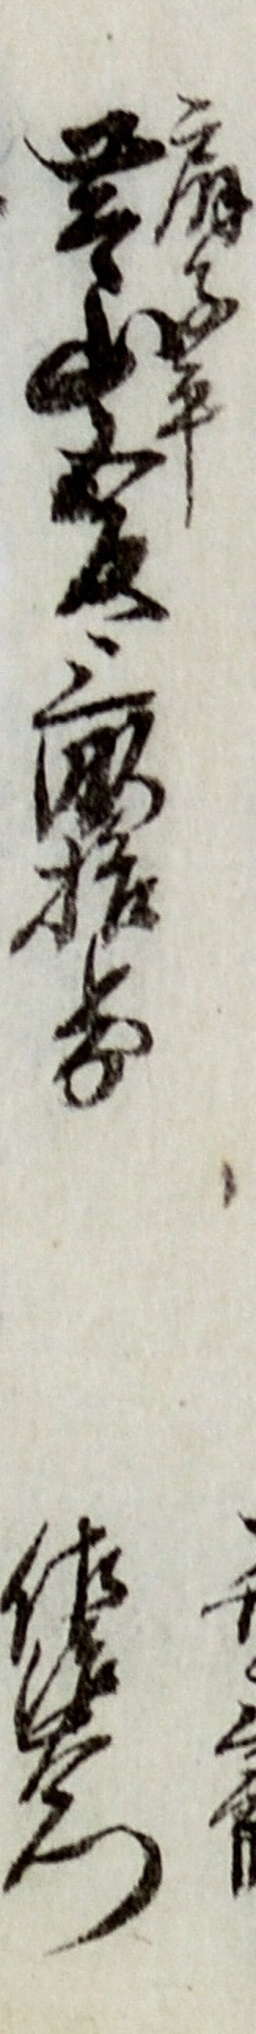芝山五反三畝拾歩佐治右衛門
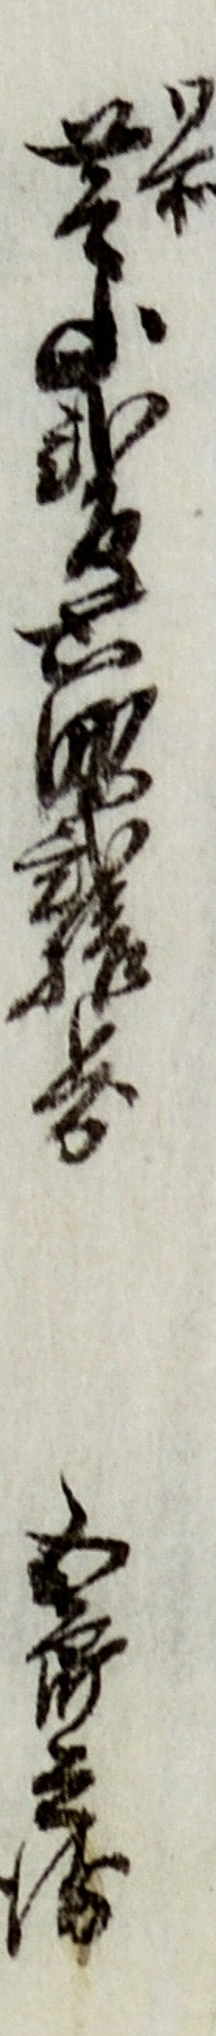芝山弐反六畝弐拾歩五郎兵衛

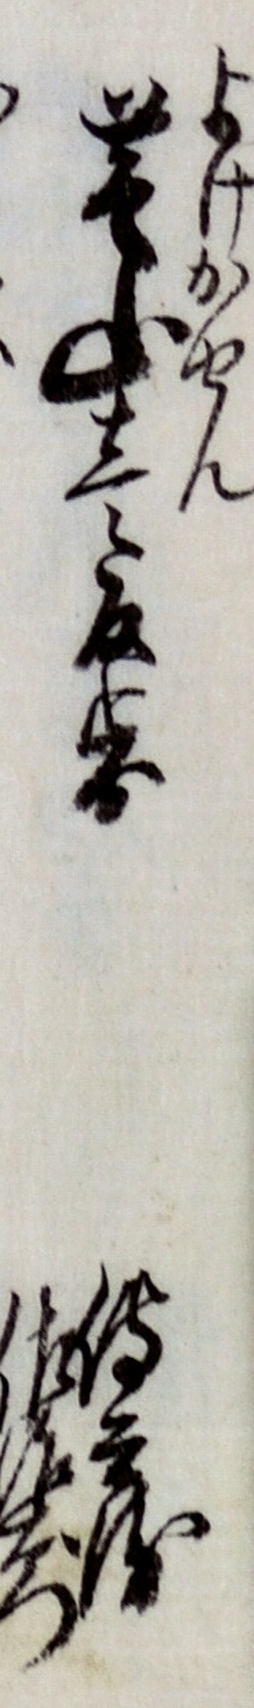芝山壱反歩半兵衛
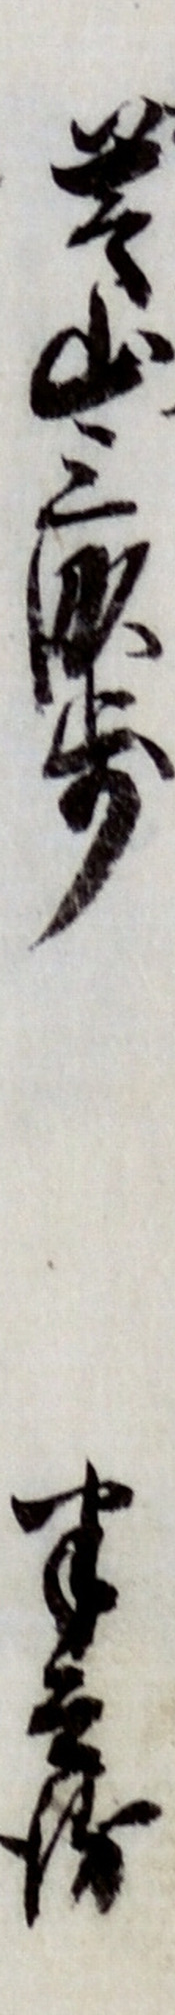芝山三畝歩半兵衛
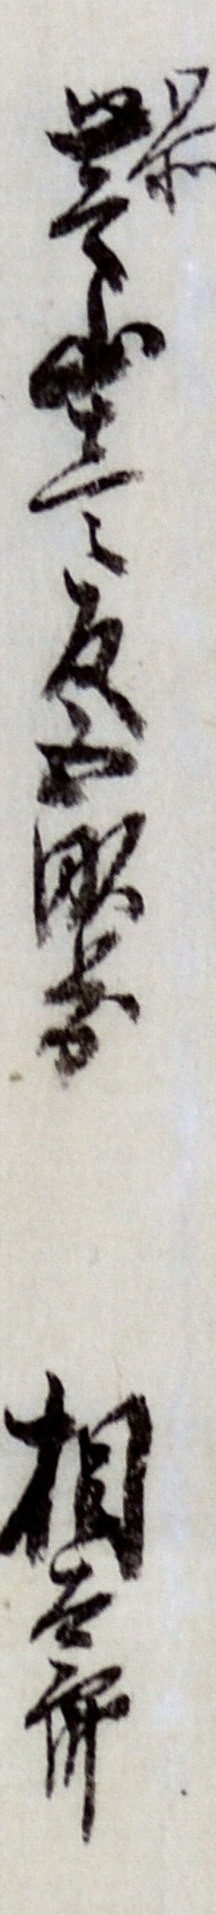芝山壱反五畝歩相太郎
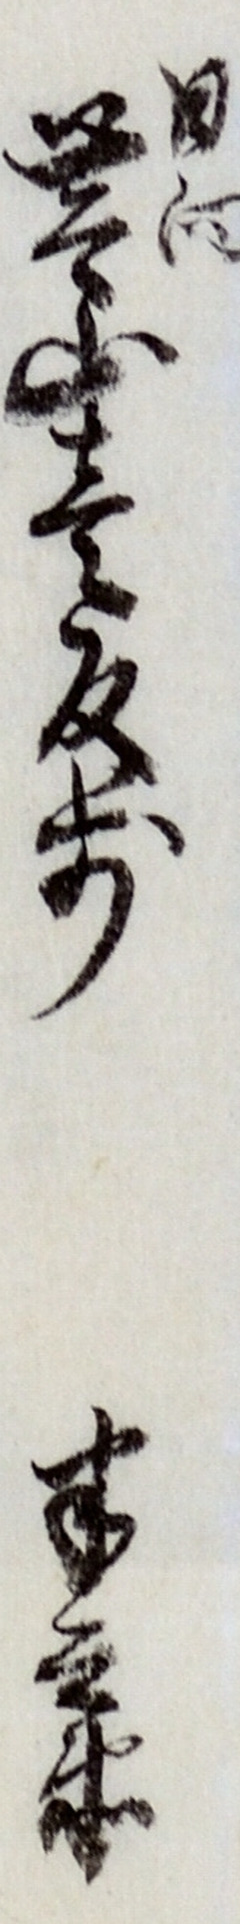芝山壱反歩半兵衛
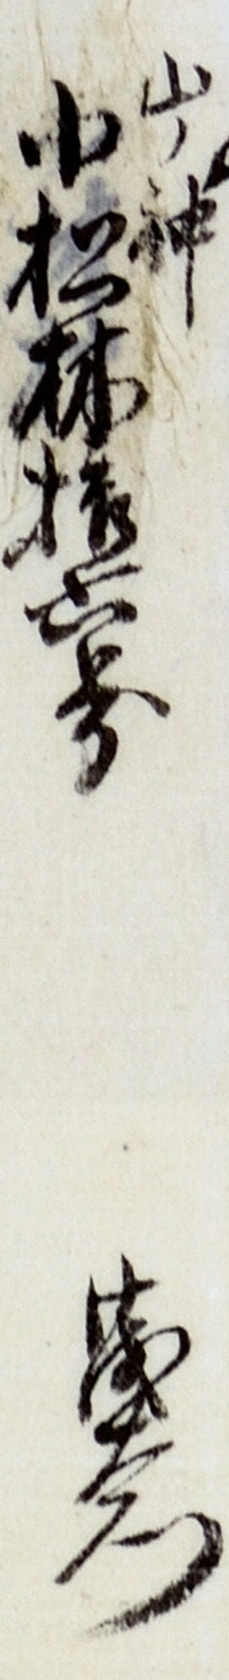小松林拾六歩茂右衛門
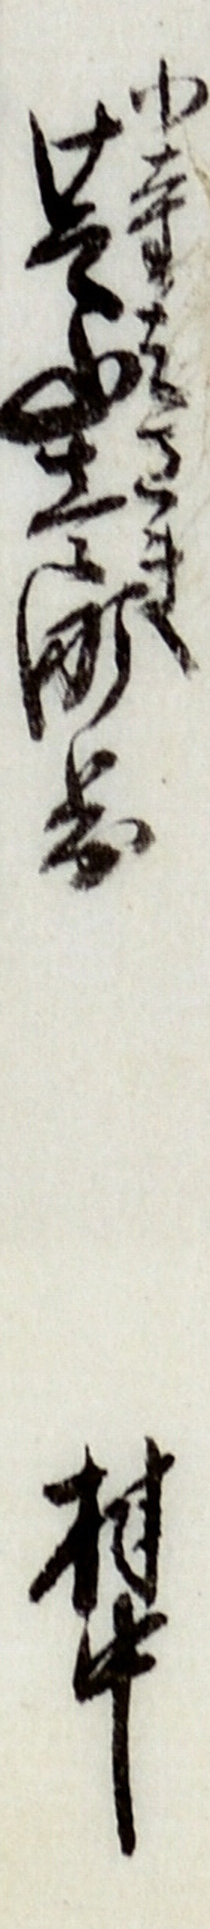芝山壱町歩村中
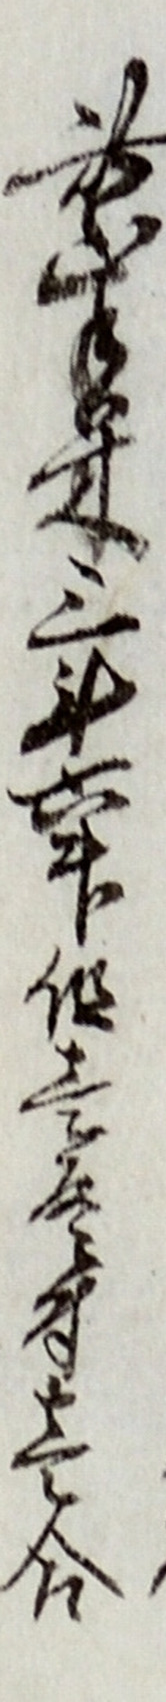此山手米三斗六升但壱反ニ付壱合
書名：御領分中山林社地手控
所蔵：伊那市立高遠町図書館・合同会社AMANE
